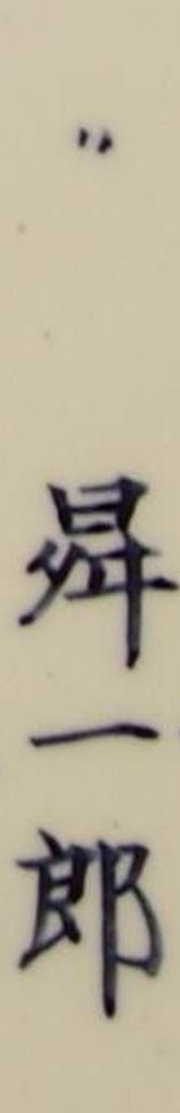昇一郎
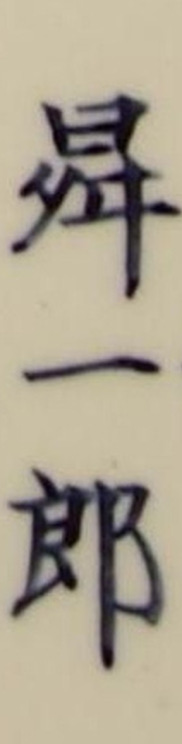昇一郎
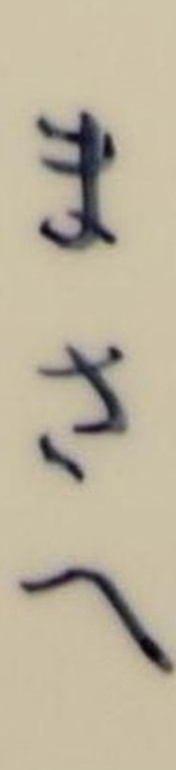まさへ
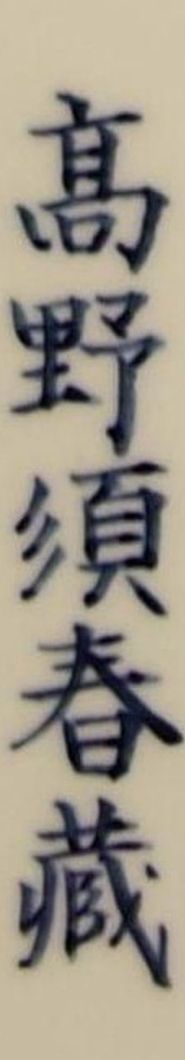高野須春蔵
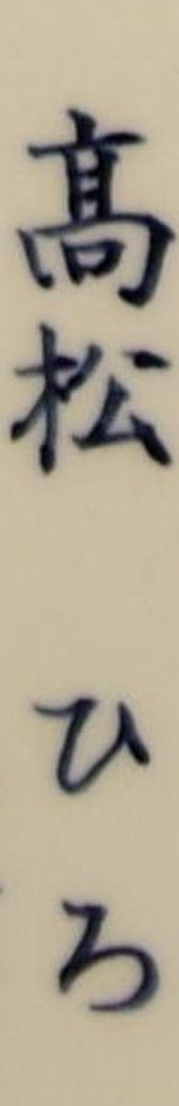高松ひろ
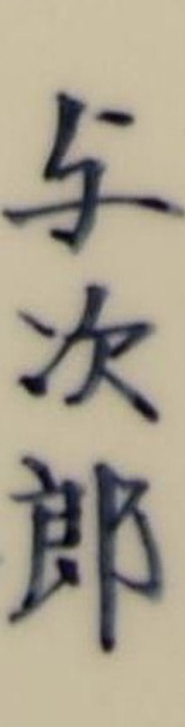与次郎
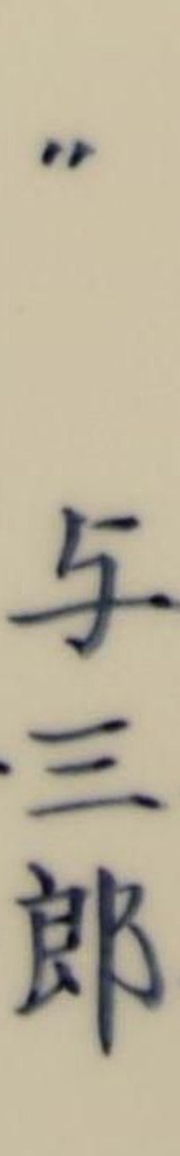与三郎
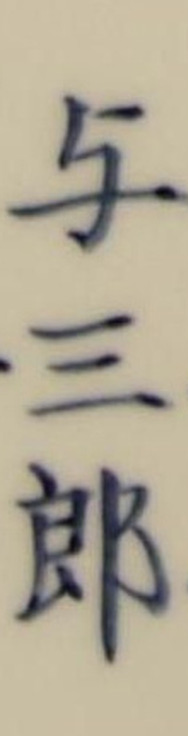与三郎
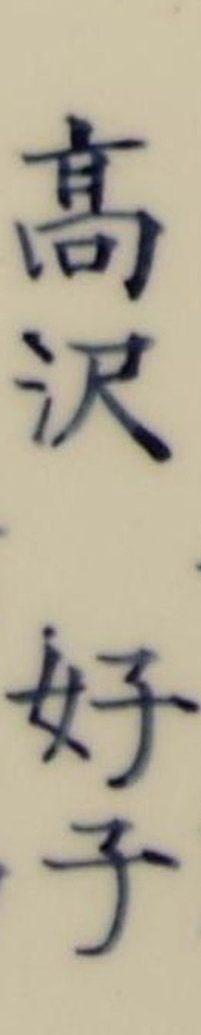高沢好子
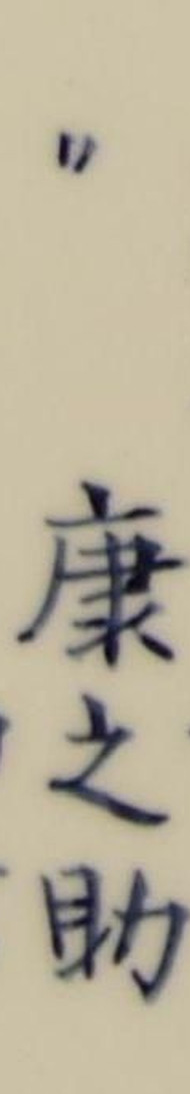康之助
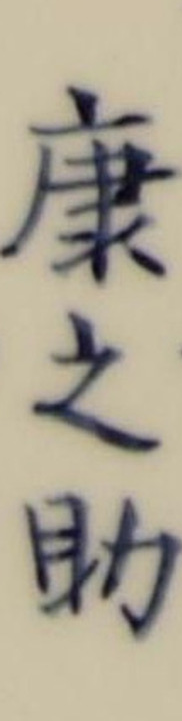康之助
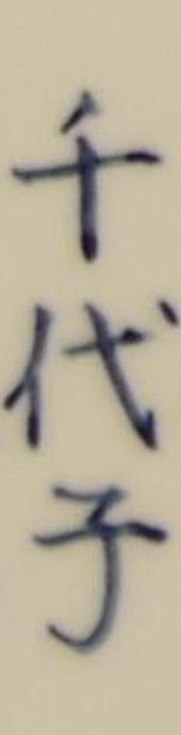千代子
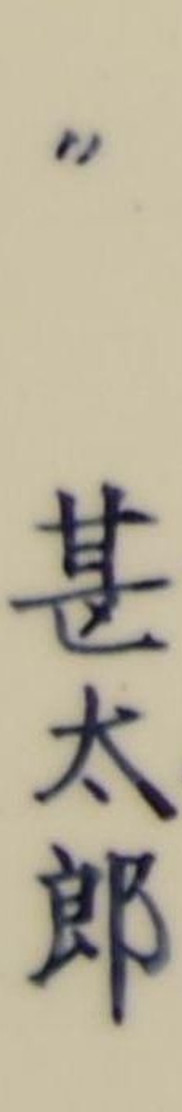甚太郎
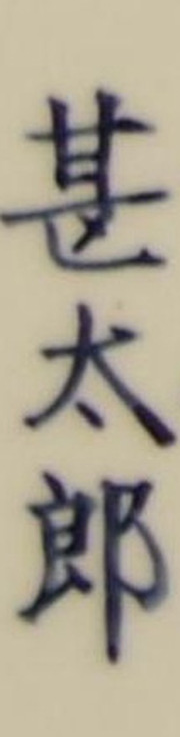甚太郎
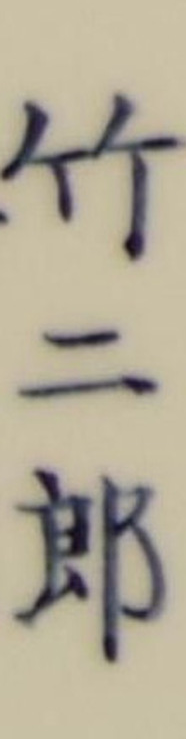竹二郎
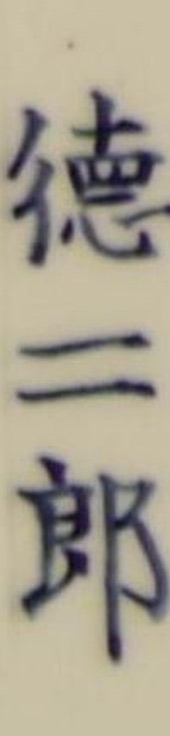徳二郎
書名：A~D
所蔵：koyasan kongobuji
